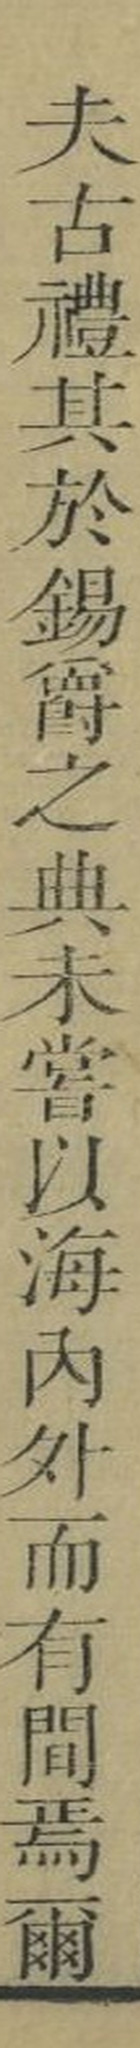夫古礼其於錫爵之典未嘗以海内外而有間焉爾
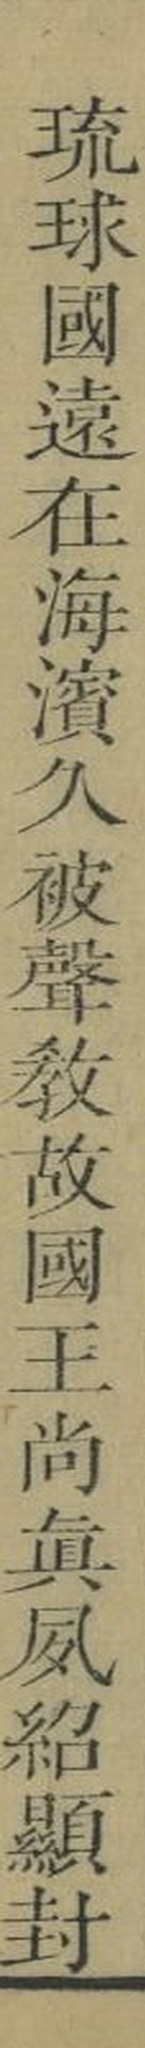琉球国遠在海浜久被声教故国王尚真夙紹顕封
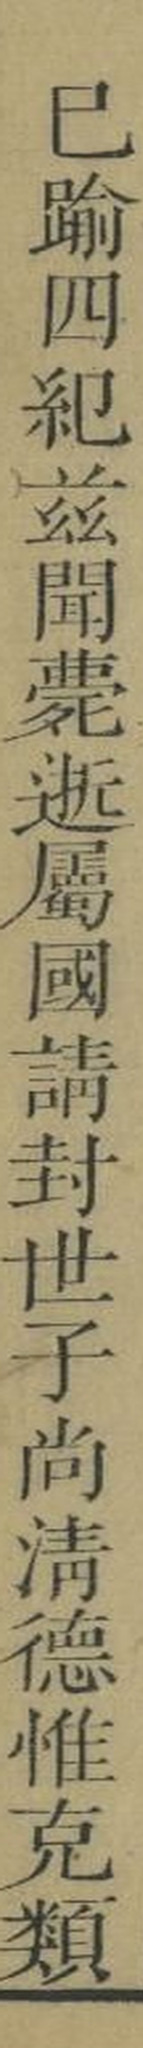巳踰四紀茲聞薨逝属国請封世子尚清徳惟克類

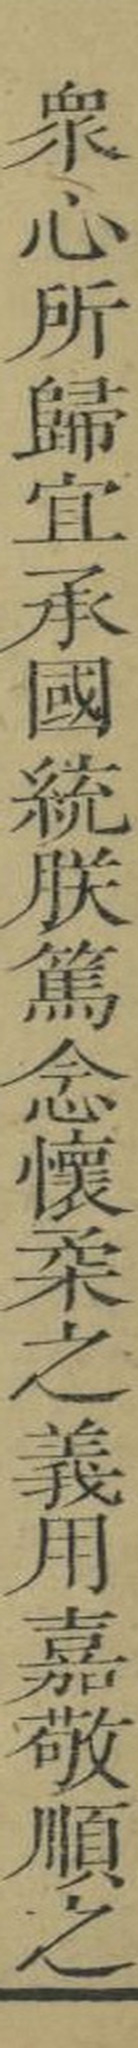衆心所帰宜承国統朕篤念懐柔之義用嘉敬順之
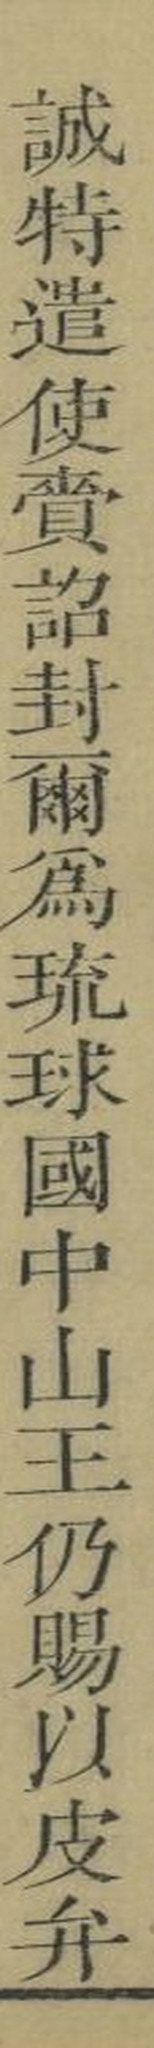誠特遣使賚詔封爾為琉球国中山王仍賜以皮弁
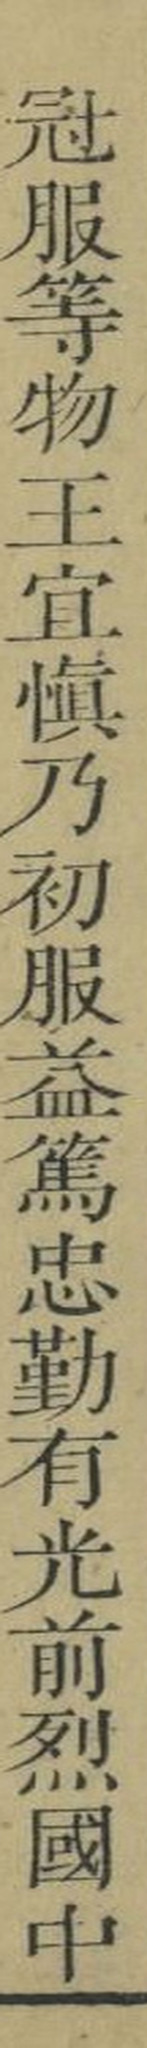冠服等物王宜慎乃初服益篤忠勤有光前烈国中
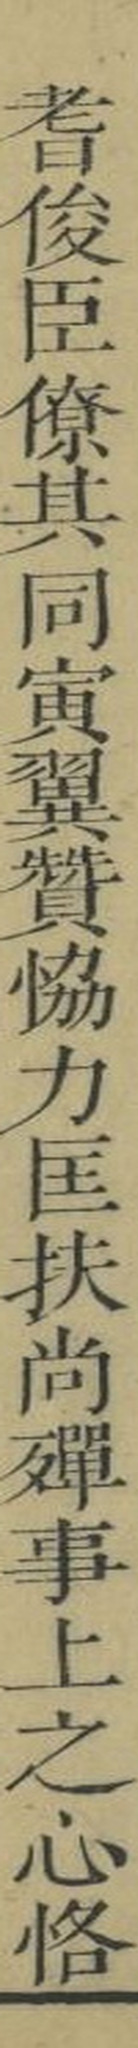耆俊臣僚其同寅翼賛恊力匡扶尚殫事上之心恪
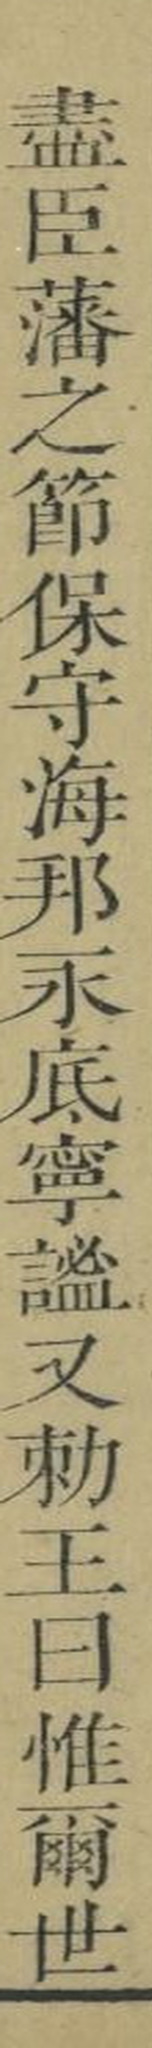尽臣藩之節保守海邦永底寧謐又勅王曰惟爾世
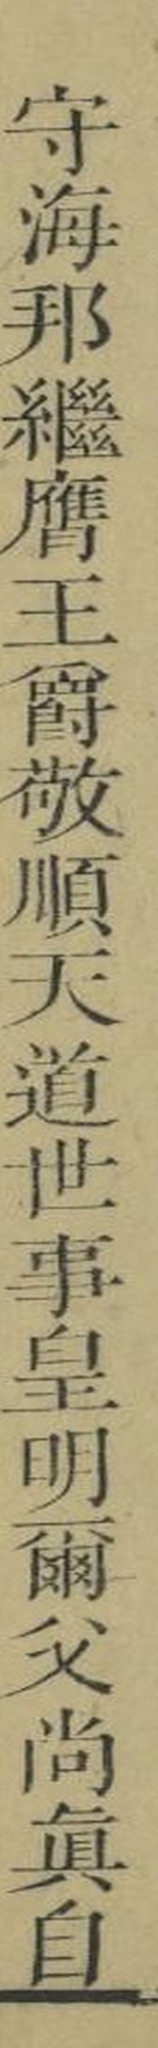守海邦継膺王爵敬順天道世事皇明爾父尚真自
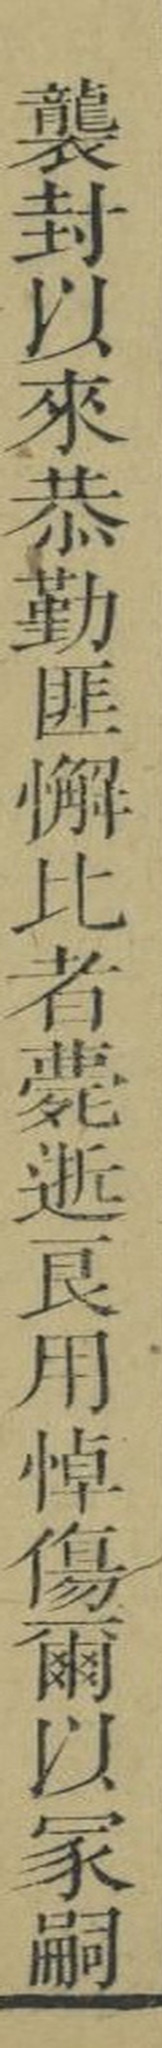襲封以来恭勤匪懈比者薨逝良用悼傷爾以冢嗣
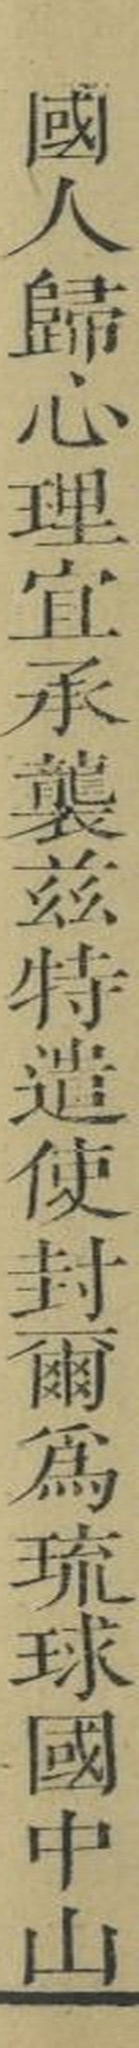国人帰心理宜承襲茲特遣使封爾為琉球国中山
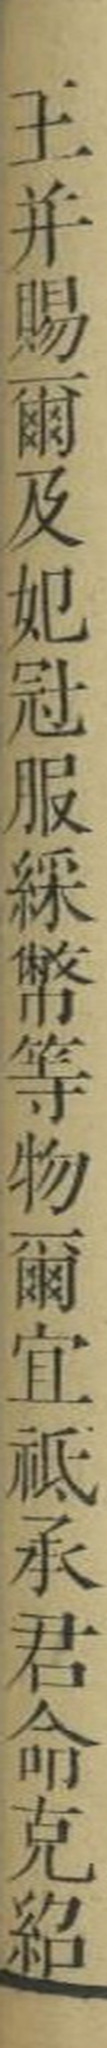王并賜爾及妃冠服綵幣等物爾宜祇承君命克紹
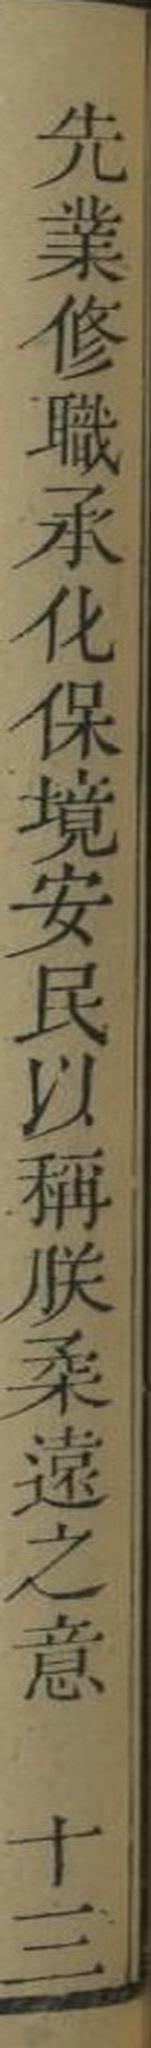先業修職承化保境安民以称朕柔遠之意十三
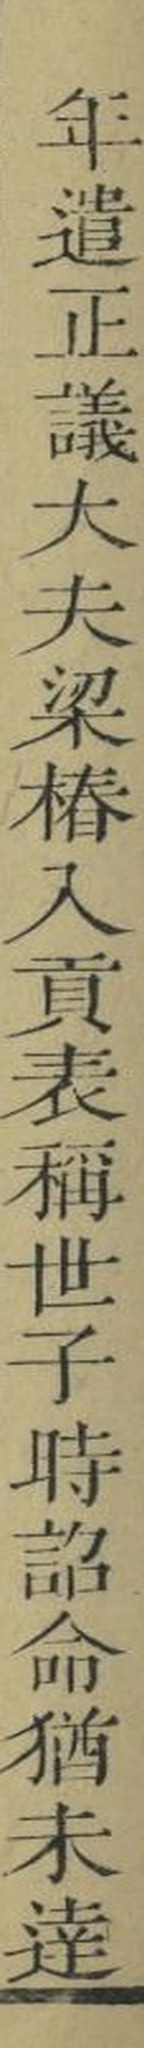年遣正議大夫梁椿入貢表称世子時詔命猶未達
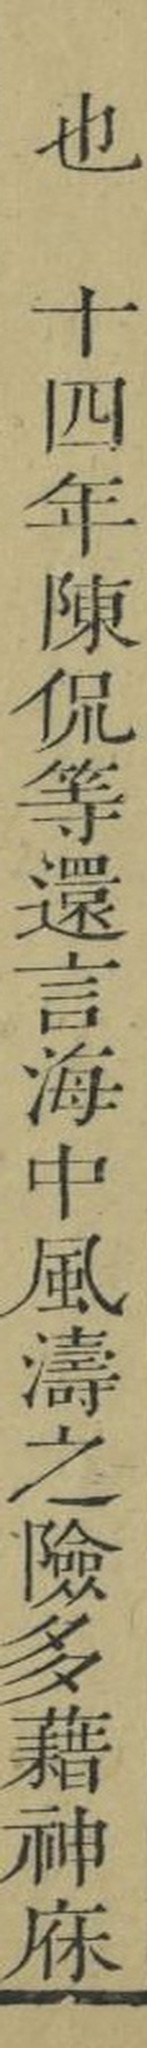也十四年陳侃等還言海中風濤之険多藉神庥
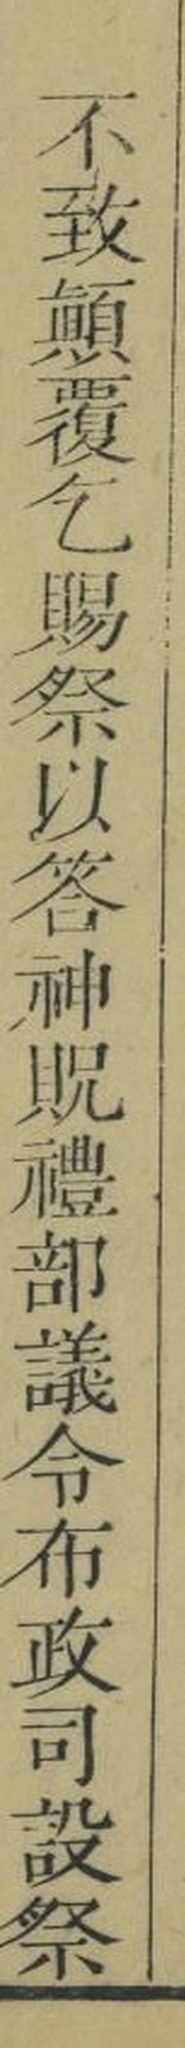不致顚覆乞賜祭以答神貺礼部議令布政司設祭
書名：中山伝信録 巻三
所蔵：University of the Ryukyus Library
